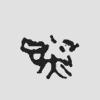氣
